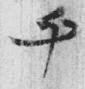父
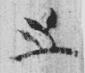之
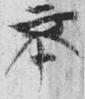不
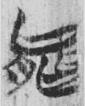能
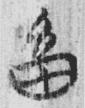畜
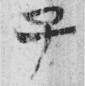子
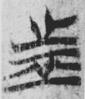者
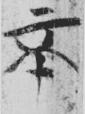不
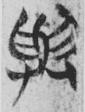與
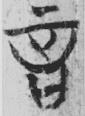言
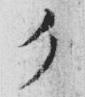人
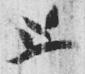之
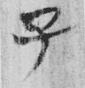子
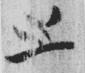之
